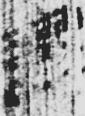韋（畏）
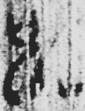也
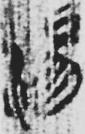湯（揚）
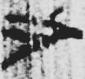之
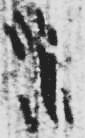水
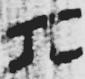亓（其）
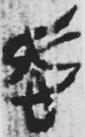○（愛）
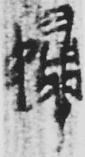婦
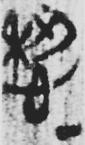悡（烈）
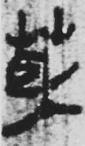菜（采）
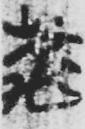○（葛）
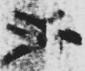之
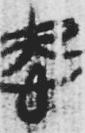○（愛）
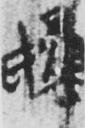婦
